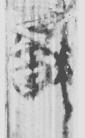猶
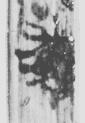爲
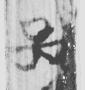厽
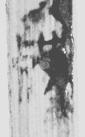殜
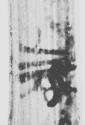者
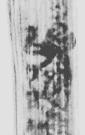既
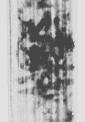爲
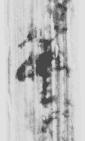身
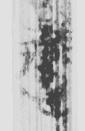𢝬
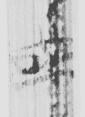或
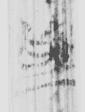爲
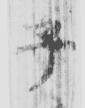子
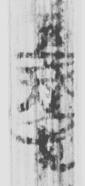𢝬
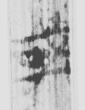或
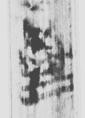爲
